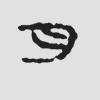月
